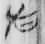左
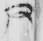尹
